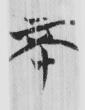不
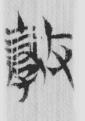{㱿子}
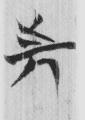先
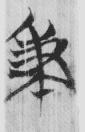秉
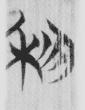利
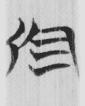於
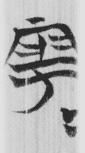雨于=
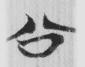公
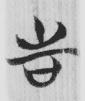告
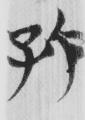孤
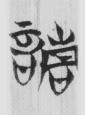請
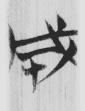成
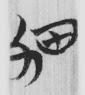男
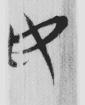女
